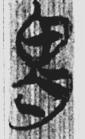胃（謂）
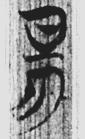昜（陽）
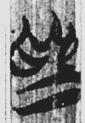爲
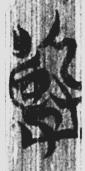○（賢）
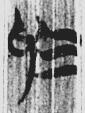於
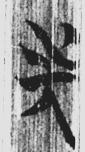先
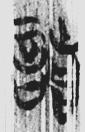請
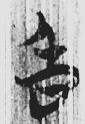昏（問）
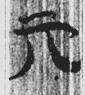亓（其）
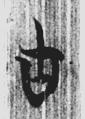古（故）
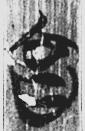○（答）
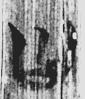曰
